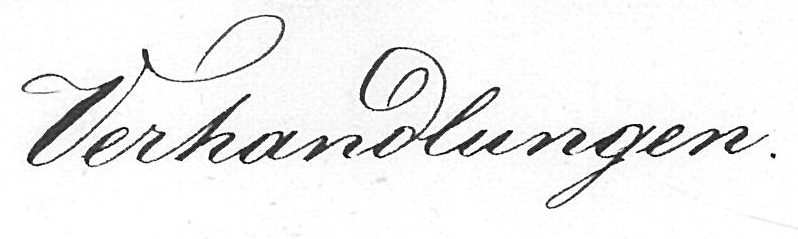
Verhandlungen.
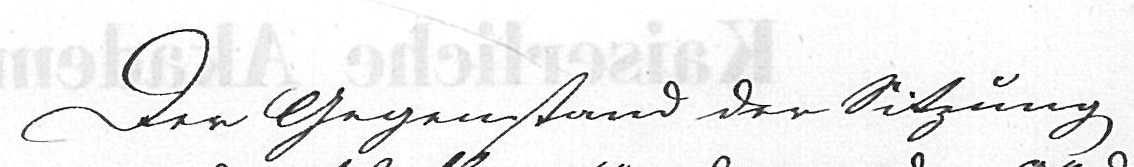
Der Gegenstand der Sitzung
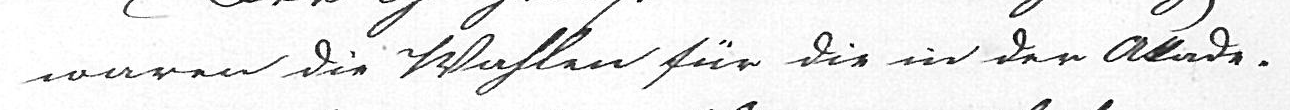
waren die Wahlen für die in der Akade-
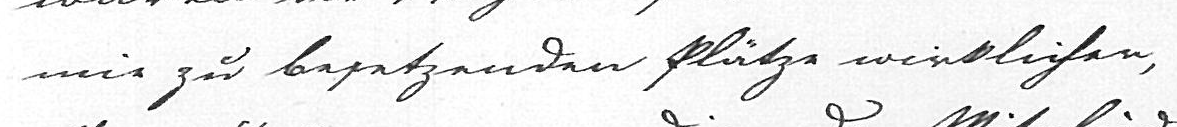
mie zu besetzenden Plätze wirklichen,
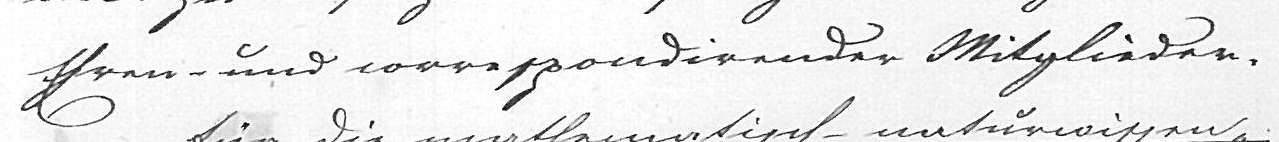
Ehren- und correspondirender Mitglieder.
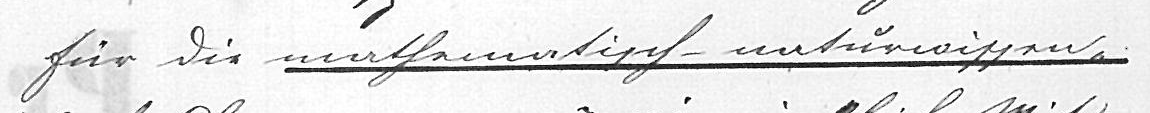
Für die mathematisch-naturwissen-
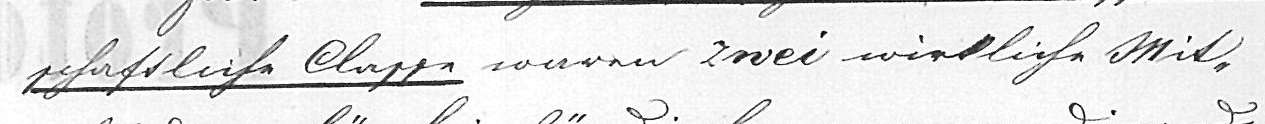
schaftliche Classe waren zwei wirklichen Mit-
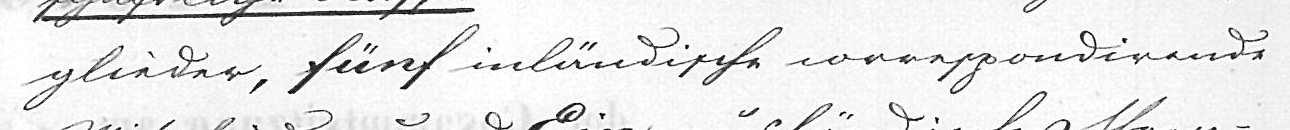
glieder, fünf inländische correspondirende
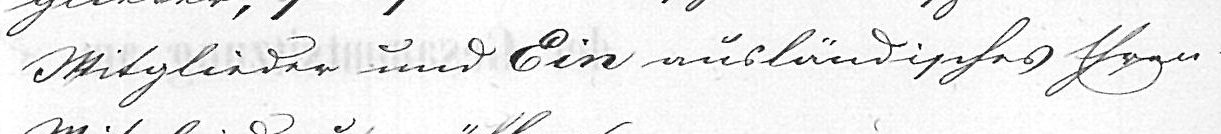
Mitglieder und Ein ausländisches Ehren-
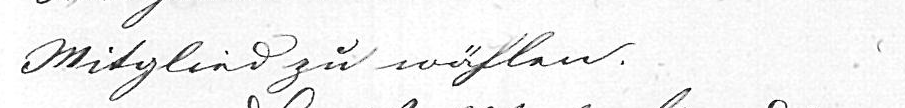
Mitglied zu wählen.
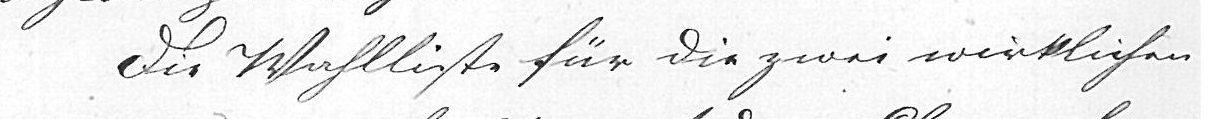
Die Wahlliste für die zwei wirklichen
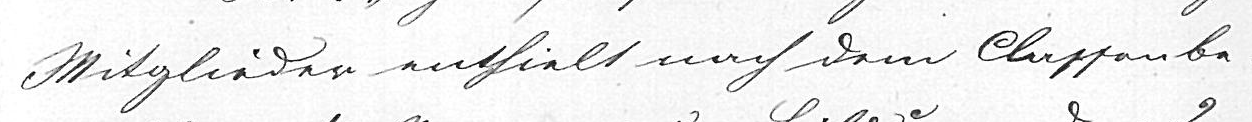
Mitglieder enthielt nach dem Classenbe-
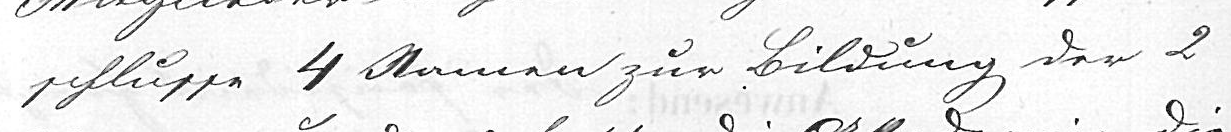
schlusse 4 Namen zur Bildung der 2
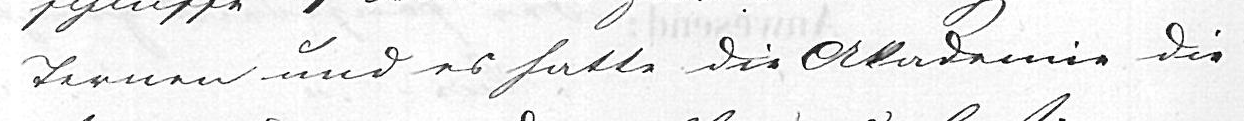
Ternen und es hatte die Akademie die
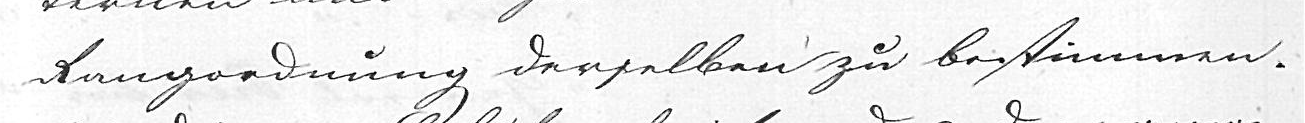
Rangordnung derselben zu bestimmen.
